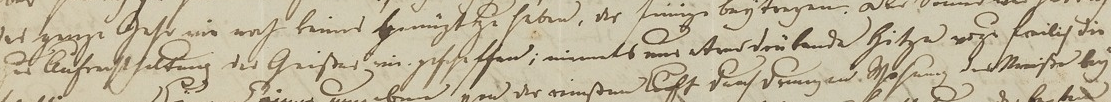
zur Aufrechthaltung des Geistes wie geschaffen; niemals nur etwas drükende Hitze wozu freilich die
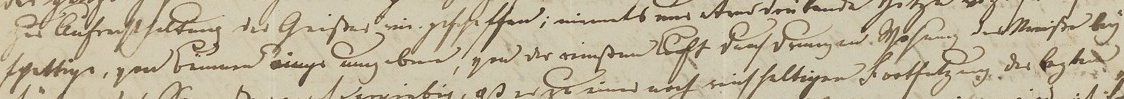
schattige, von Bäumen rings umgebene, von der reinsten Luft durchdrungne Wohnung das Meiste bey-
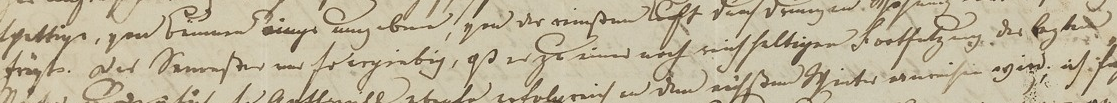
trägt. Das Semester war so ergiebig, dß es zu einer noch reichhaltigen Fortsetzung des lezten
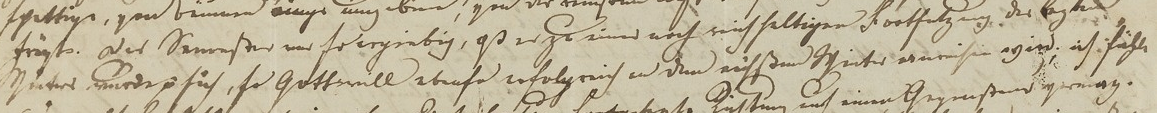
Winters wurde & sich, so Gott will ebenso erfolgreich an den nächsten Winter anreihen wird; ich fühle
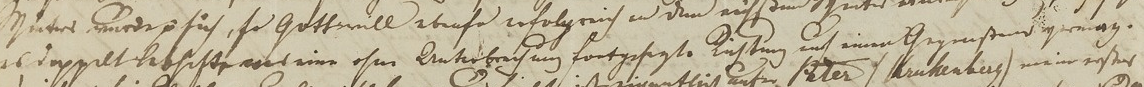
es doppelt lebhaft, was eine ohne Unterbrechung fortgesezte Richtung auf einen Gegenstand vermag.
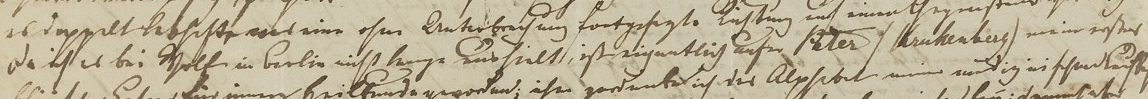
Da ich es bei Wolf in Berlin nicht lange aushielt, ist eigenthlich unser Peter (Krukenberg) mein erster
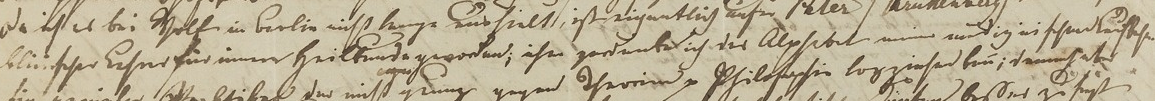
klinischer Lehrer für innere Heilkunde geworden; ihm verdanke ich das Alphabet meiner medizinischen Laufbahn.
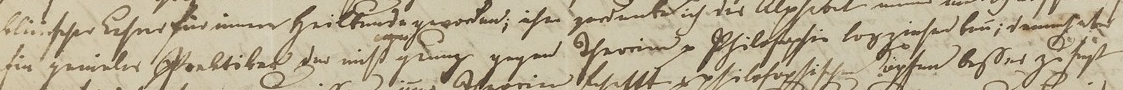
Ein genialer Praktiker der nicht genug gegen Theorien & Philosophie losziehen kann; dennoch aber
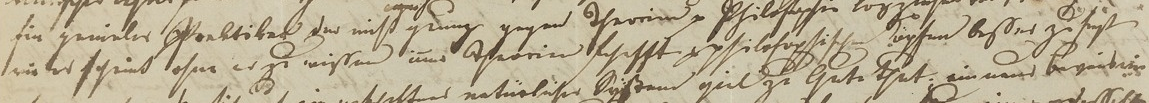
wie es scheint ohne es zu wissen immer Theorien schafft & philosophischen Köpfen besser zusagt
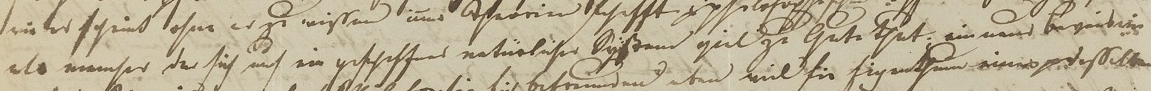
als mancher der sich auch ein geschaffnes natürliches System viel zu Gute thut; ein neuer Beweis
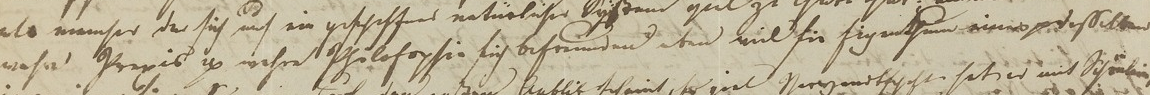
wahre Praxis & wahre Philosophie sich befreunden eben weil sie Eigenthum eines & desselben
